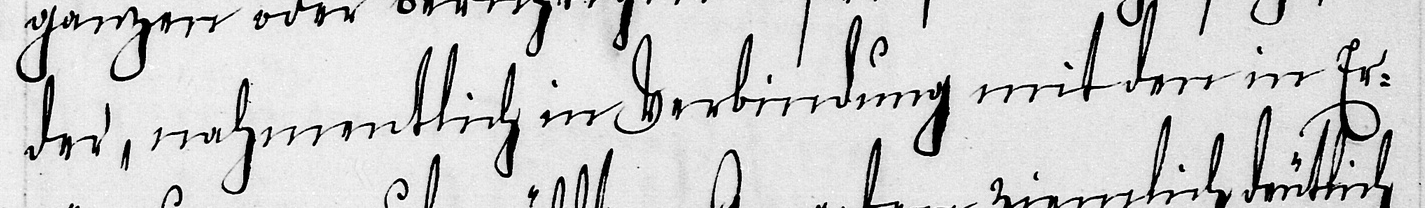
der, nahmentlich in Verbindung mit den in Er¬
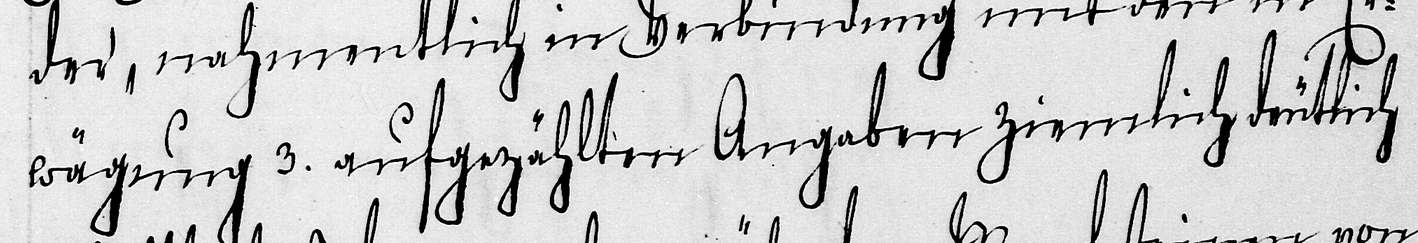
wägung 3. aufgezählten Angaben ziemlich deutlich
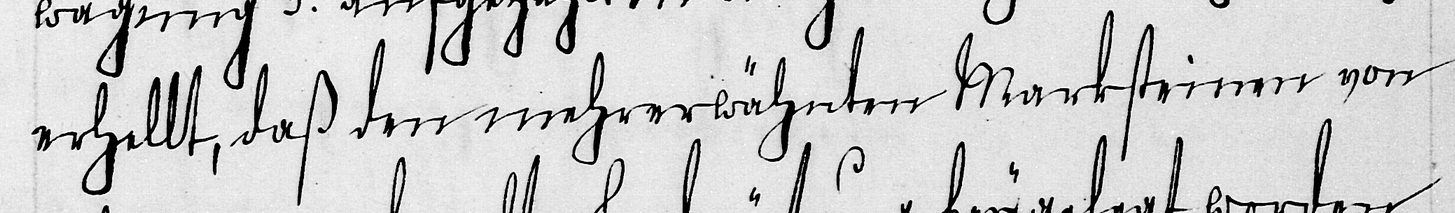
erhellt, daß den mehrerwähnten Marksteinen von
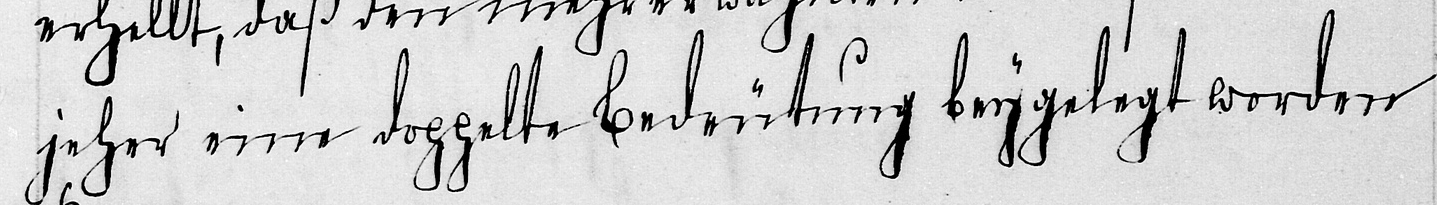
jeher eine doppelte Bedeutung beygelegt worden
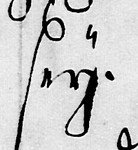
sey.
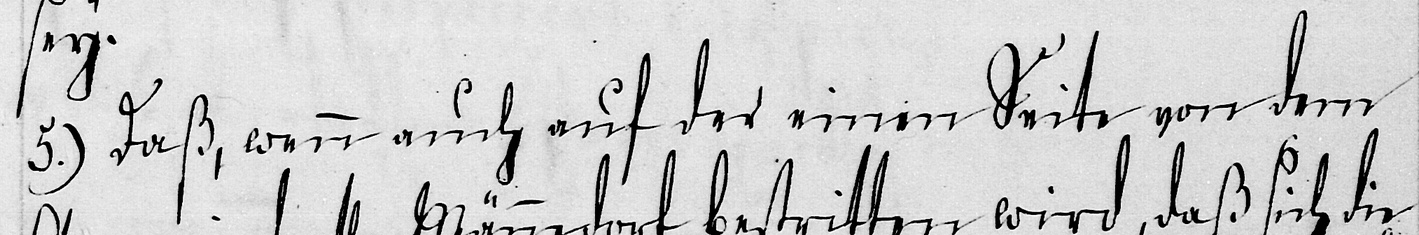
5.) Daß, wenn auch auf der einen Seite von dem
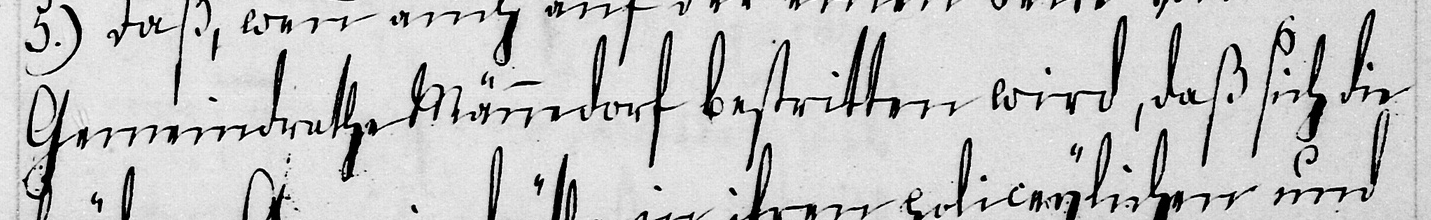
Gemeindrathe Männedorf bestritten wird, daß sich die
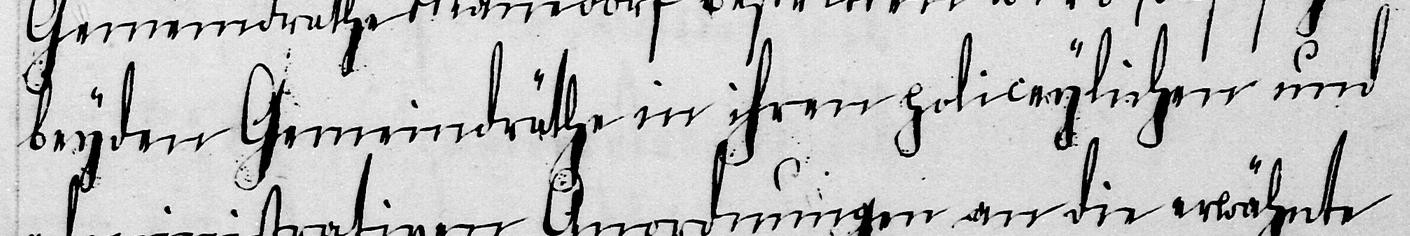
beyden Gemeindräthe in ihren policeylichen und
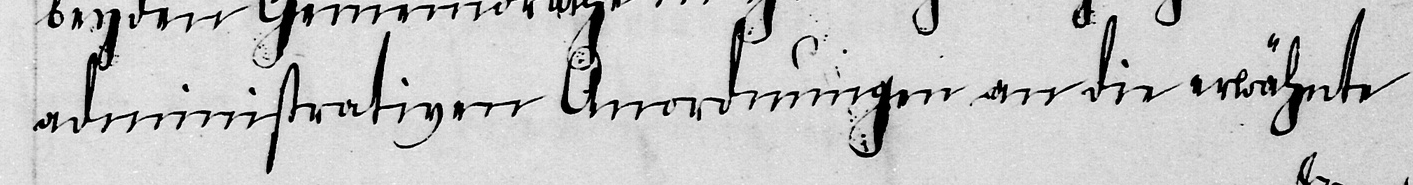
administrativen Anordnungen an die erwähnte
